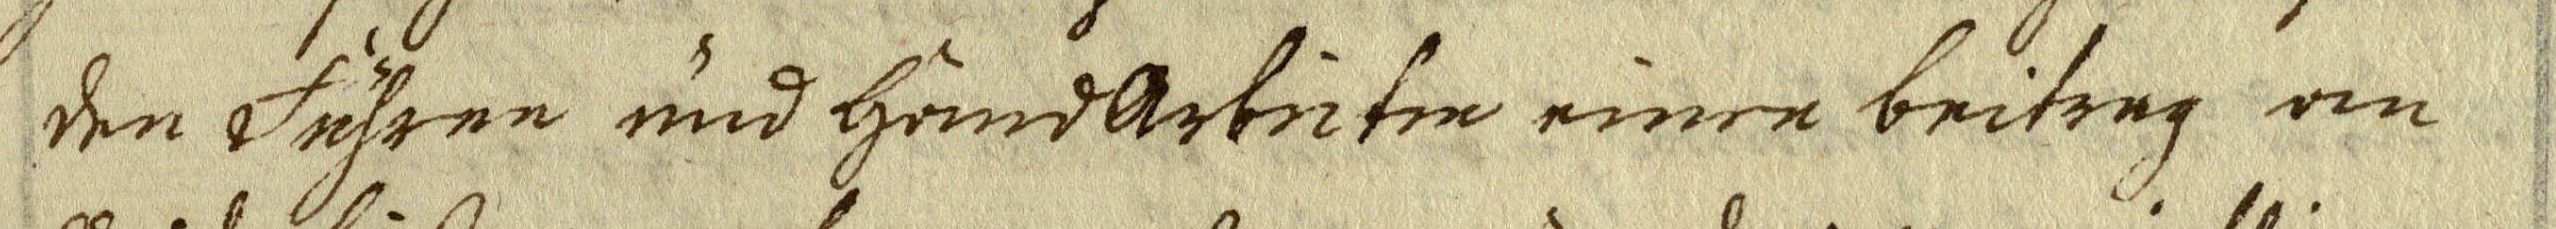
den Fuhren und Handarbeiten einen Beitrag an
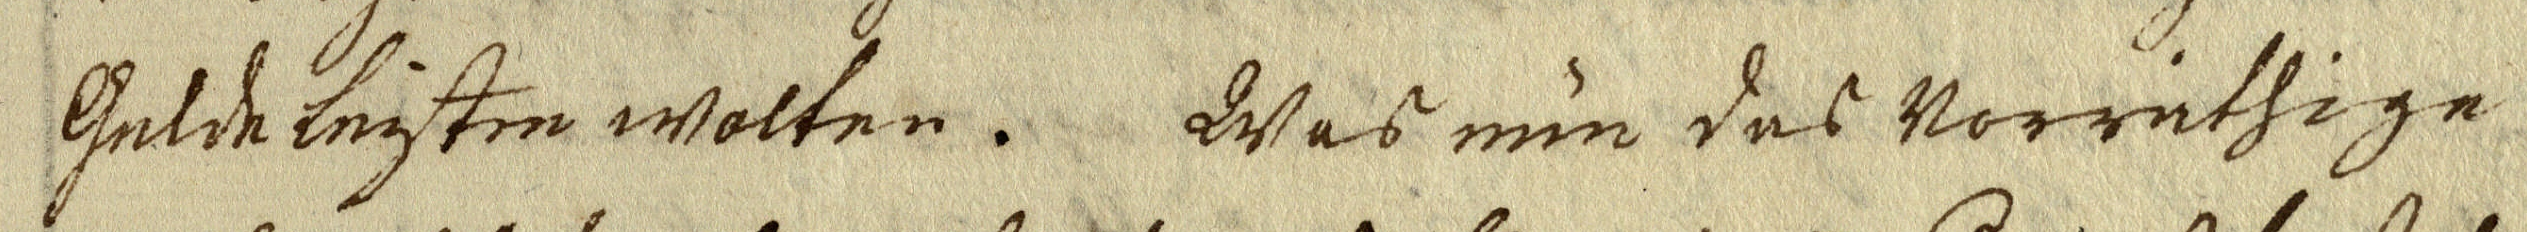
Gelde leisten wolten. Was nun das vorräthige
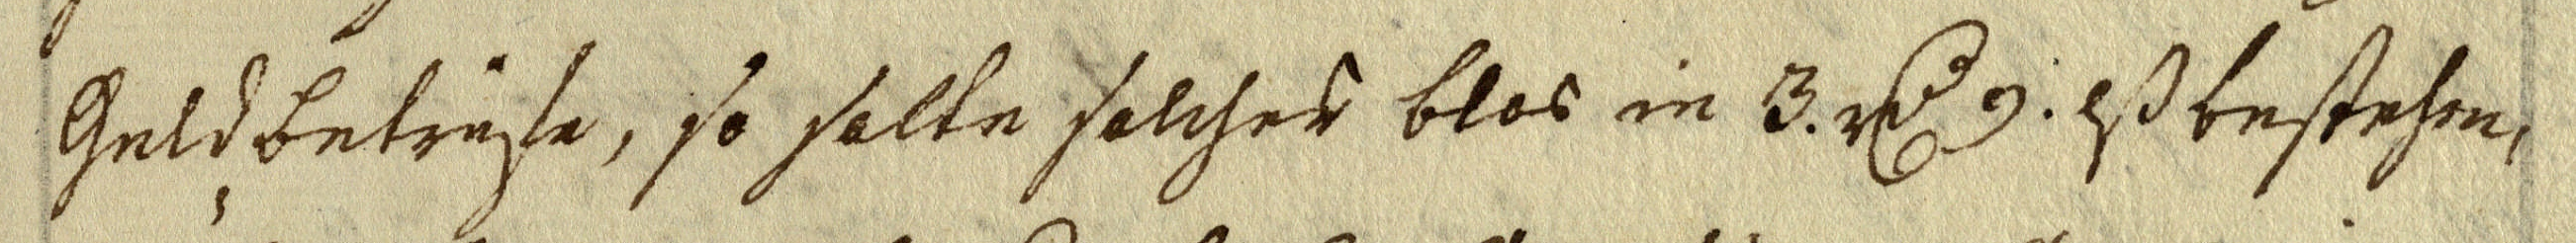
Geld beträfe, so solte solches blos in 3. r 9. s bestehen,
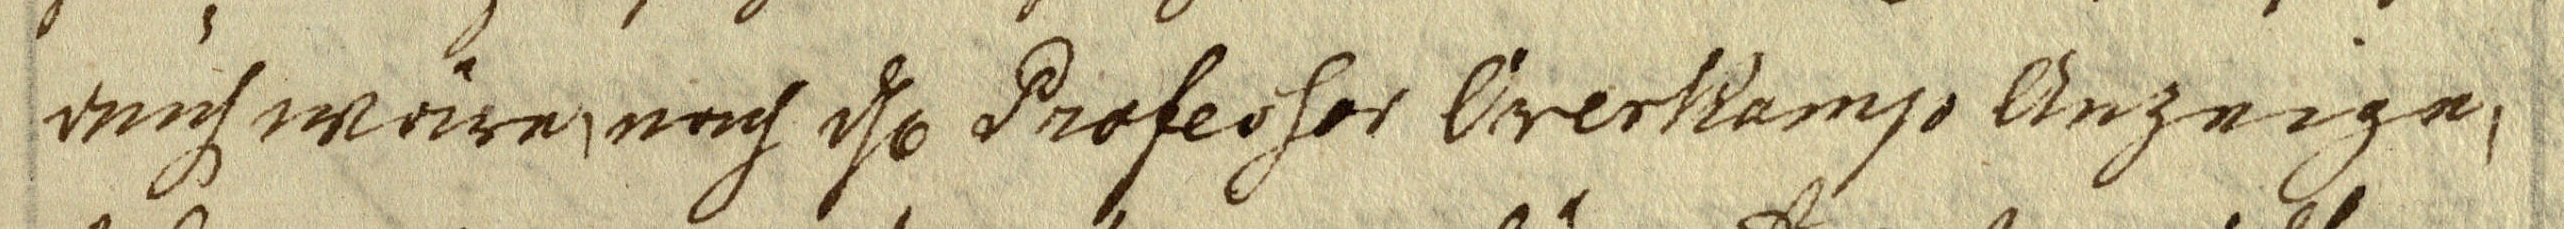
auch wäre nach dh Professor Overkamp Anzeige,
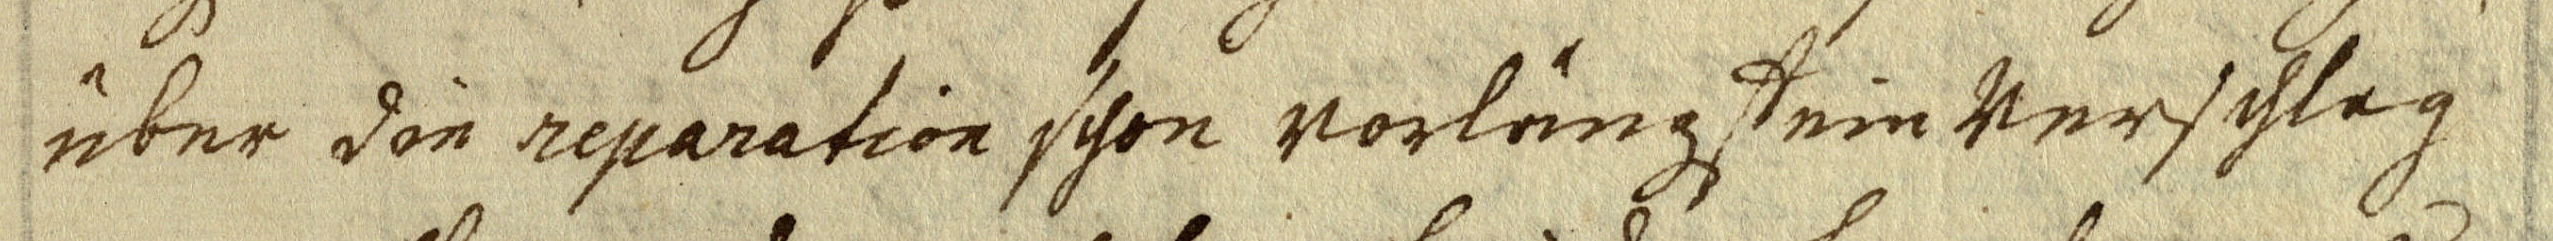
über die reparation schon vorlängst ein Vorschlag
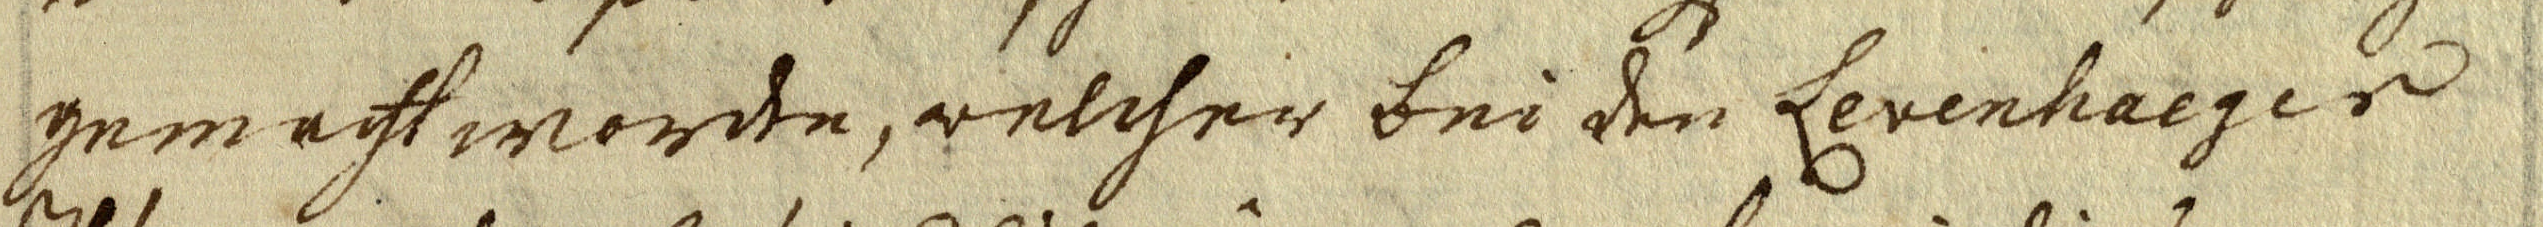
gemacht worden, welcher bei den Levenhaeger
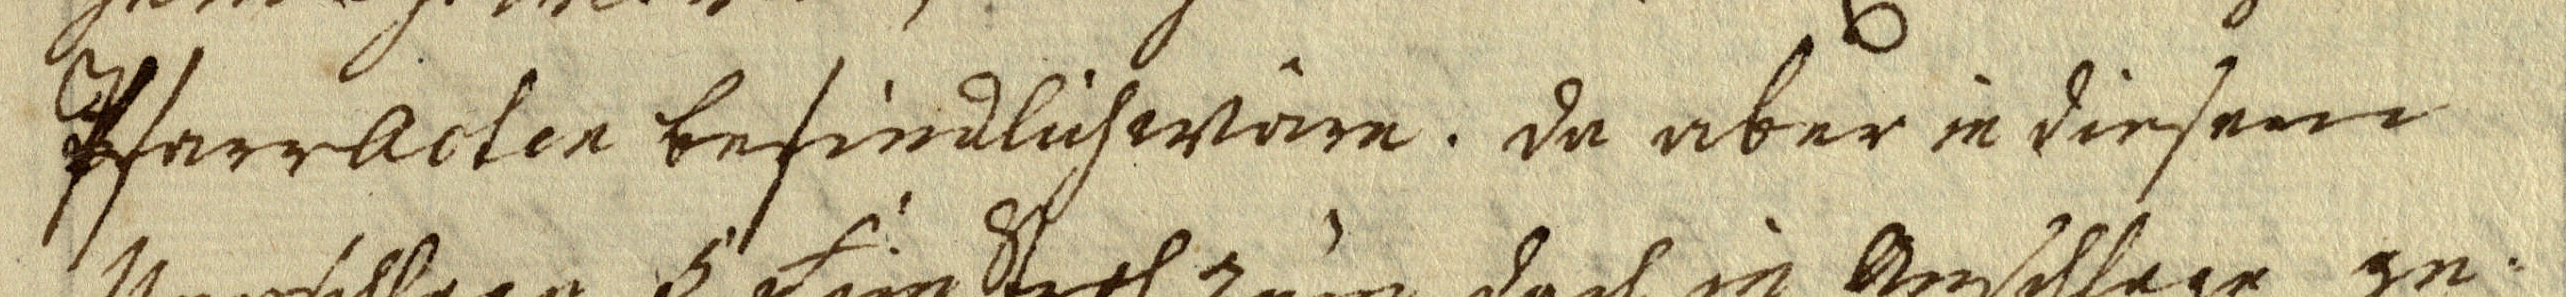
Pfarracten befindlich wäre. da aber in diesem
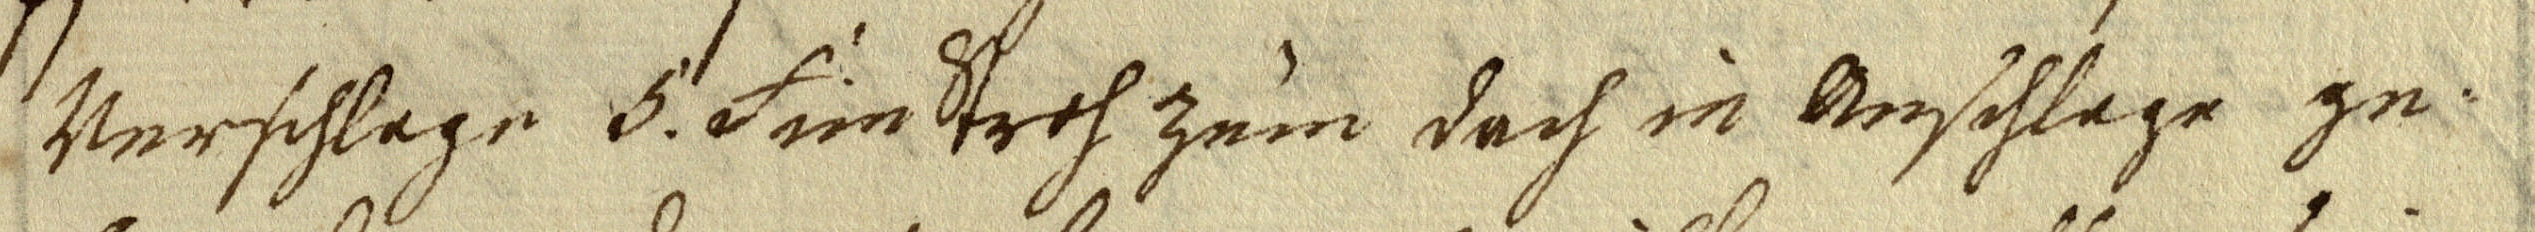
Verschlage 5. Fim Stroh zum Dach in Anschlage ge¬
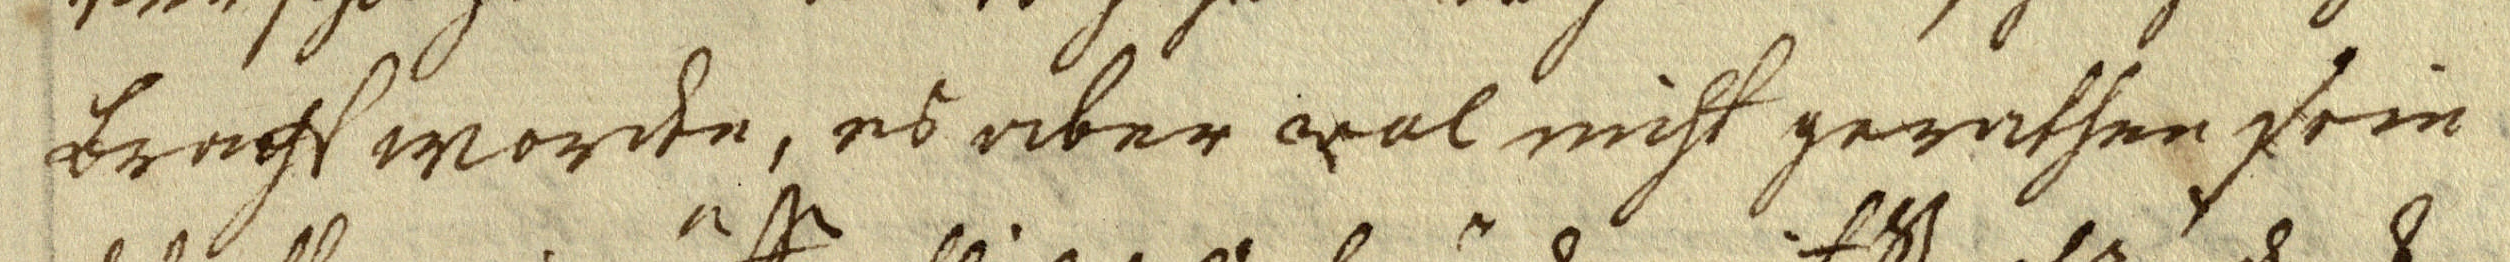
bracht worden, es aber wol nicht gerathen sein
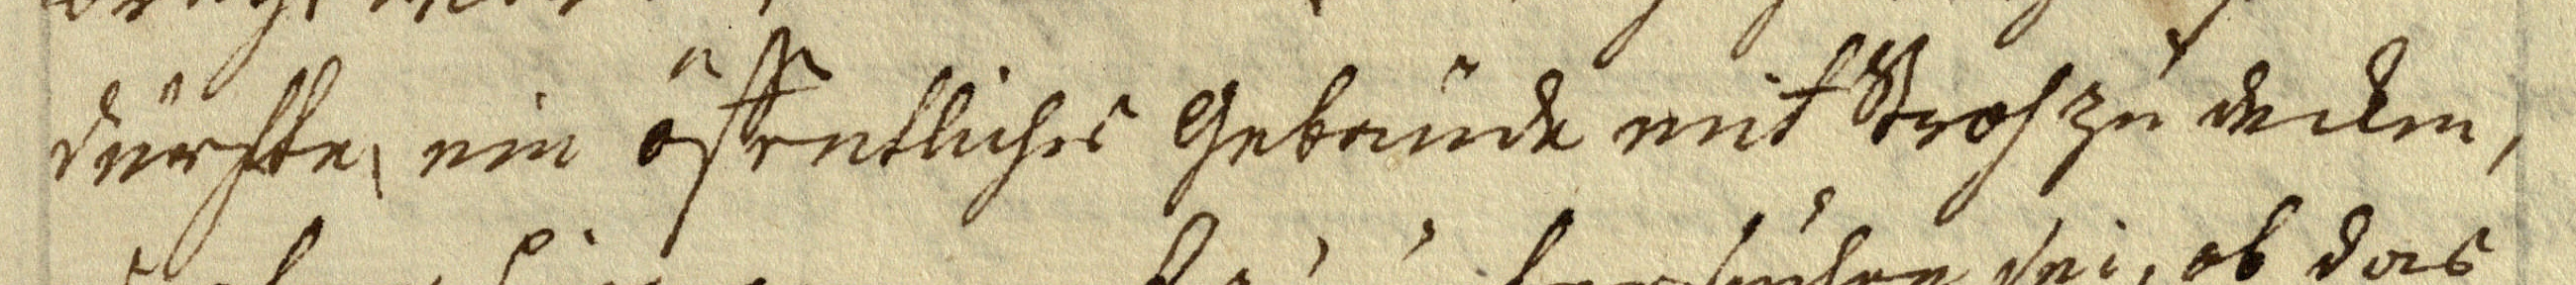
dürfte, ein öfentliches Gebäude mit Stroh zu decken,
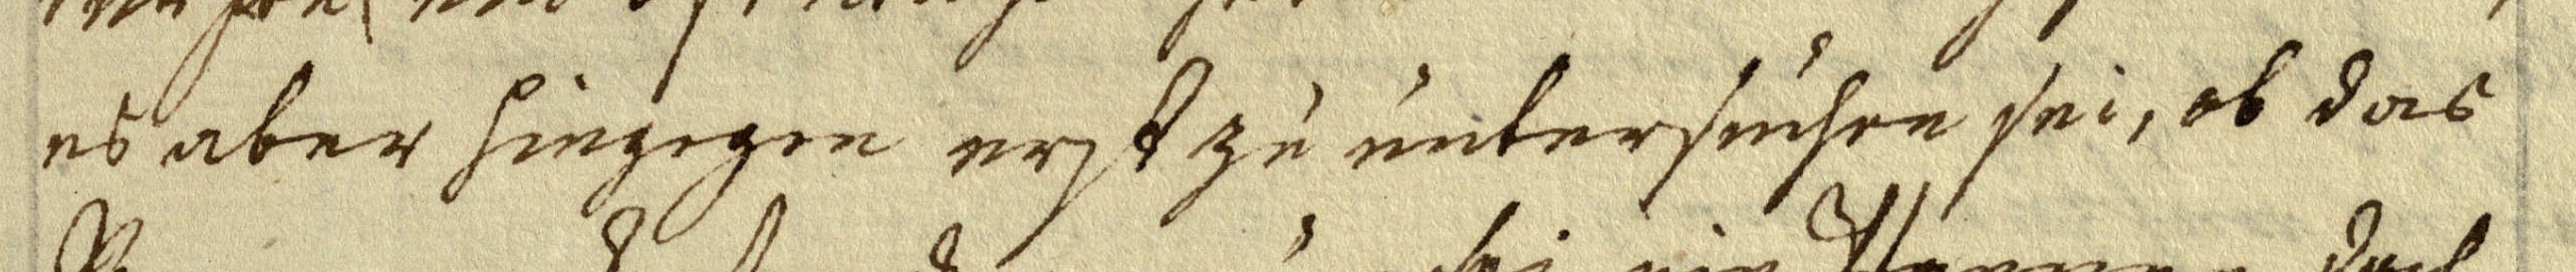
es aber hingegen erst zu untersuchen sei, ob das
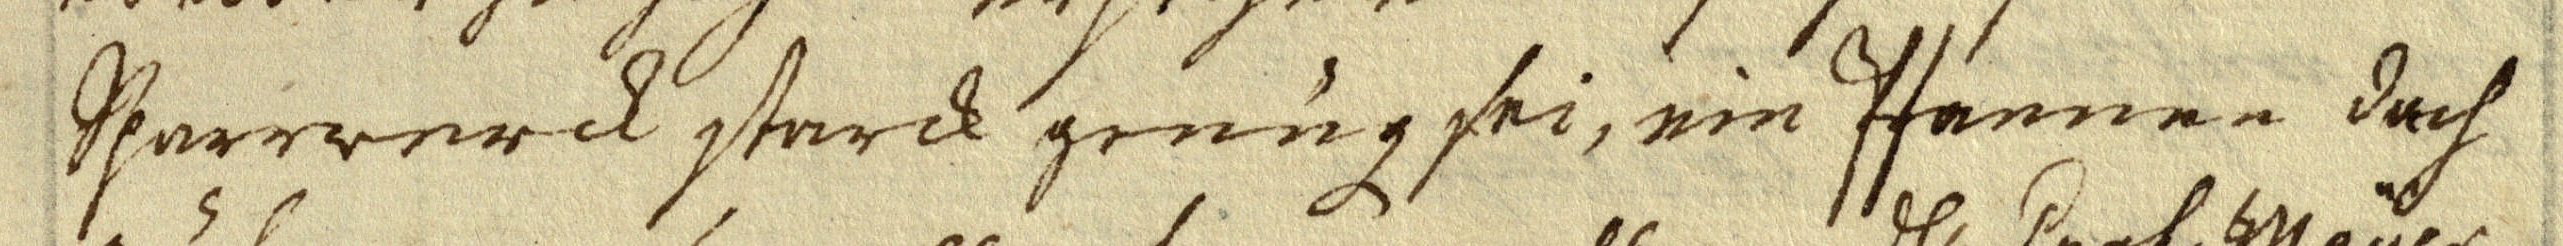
Sparrwerck starck genug sei, ein Pfannen Dach
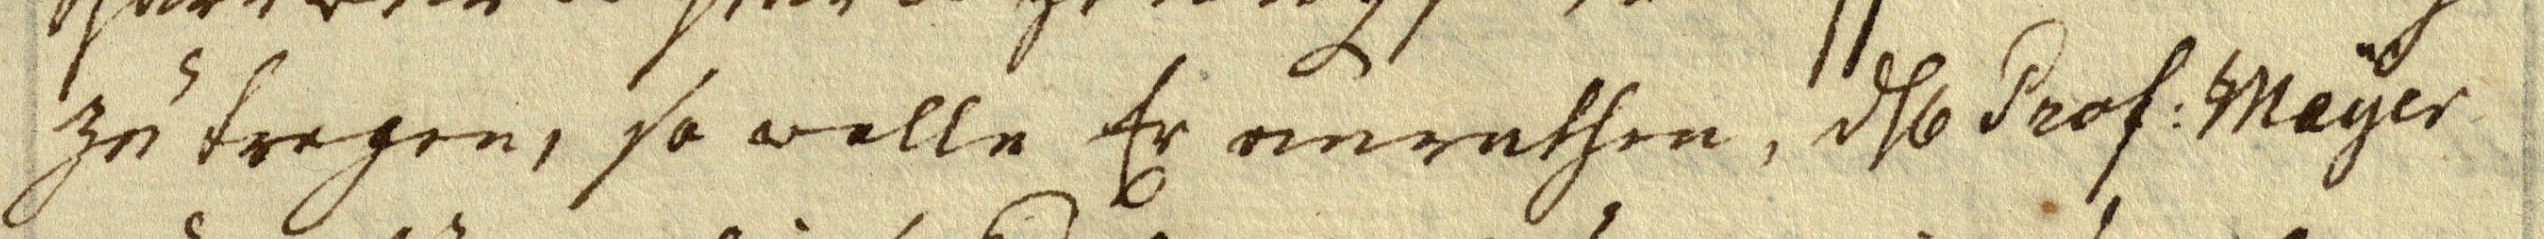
zu tragen, so wolle Er anrathen, dh Prof. Maÿer
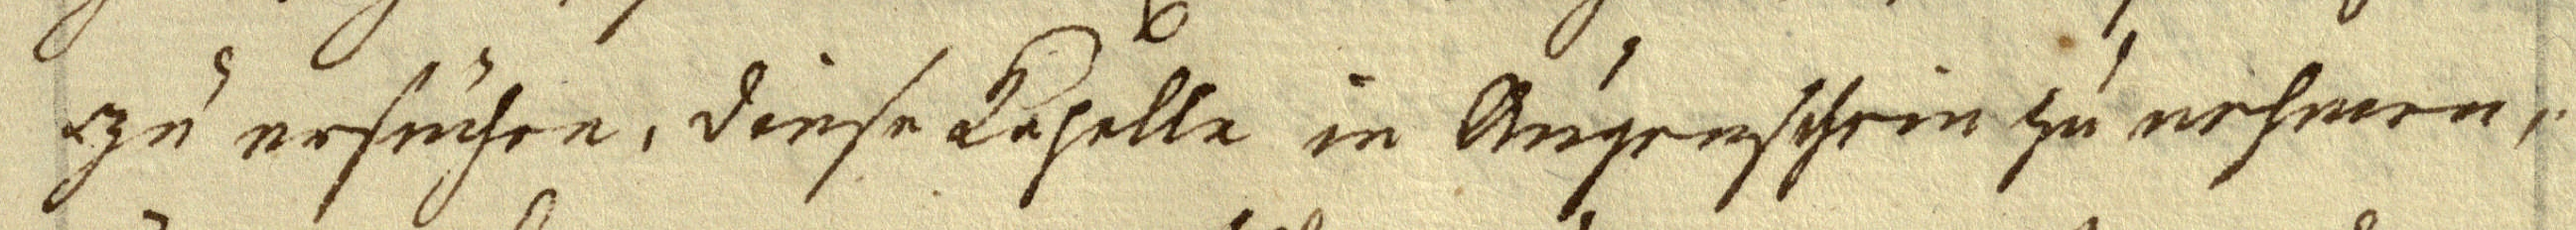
zu ersuchen, diese Kapelle in Augenschein zu nehmen,
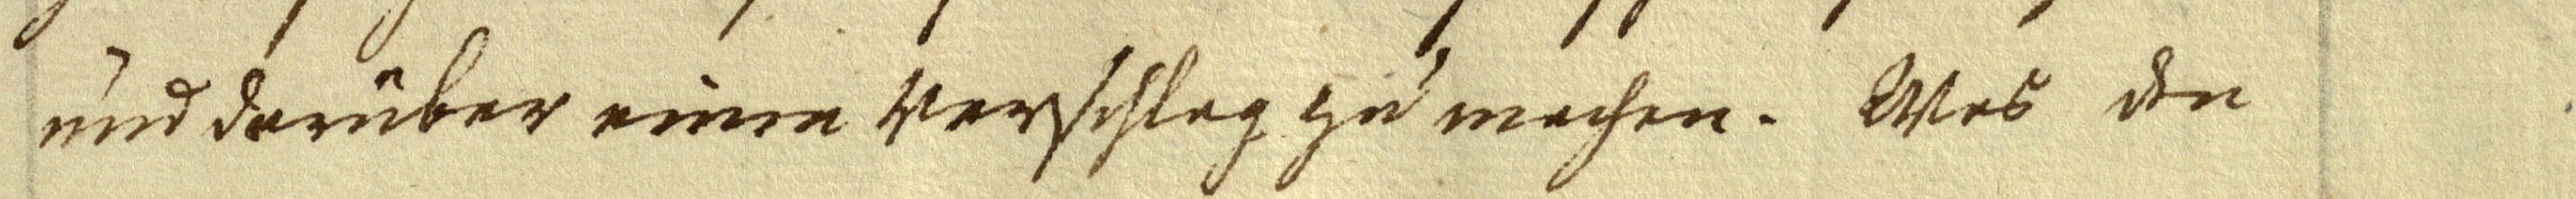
und darüber einen Vorschlag zu machen. Was den
